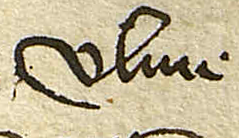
Vlme
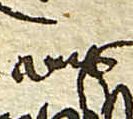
vns
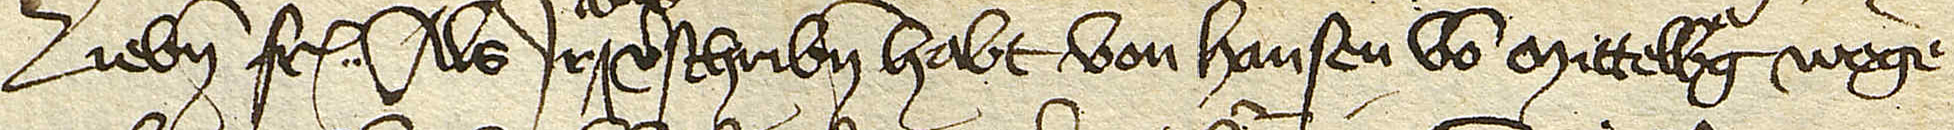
Liebn* fr* ~ Als Ir vſchribn* habt / von hanſen vo* Mittelb*g wege*
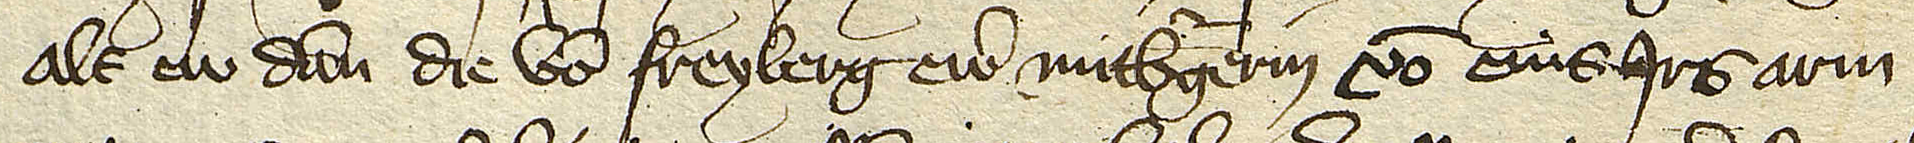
als ew dan* die vo* freyberg ew* mitb*gerin vo* eins Irs arm
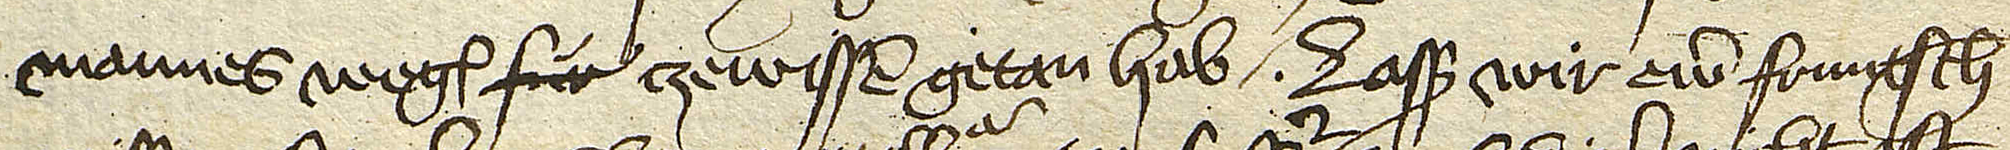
mannes weg* für cʒewiſſe* getan hab / . Laſſ* wir ew* fruntſch*
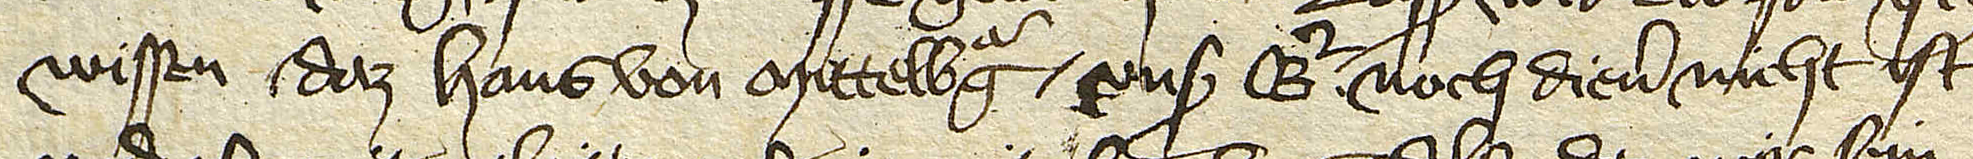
wiſſen / daʒ hans von Mittelb*g / vnſ* B* noch dien* nicht iſt
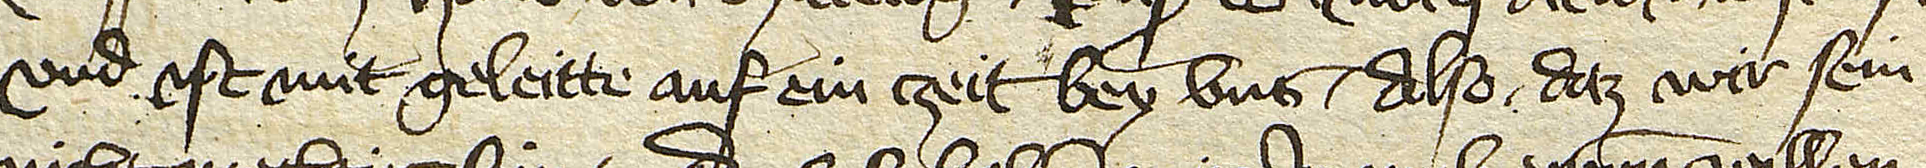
vnd iſt mit geleitte auf ein cʒeit bey vns / Alſo / daʒ wir ſein
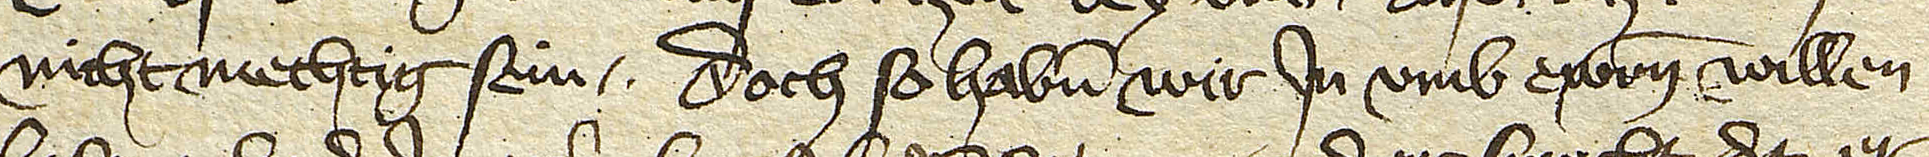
nicht mechtig ſein / . Doch ſo habn* wir In vmb ewrn* willen
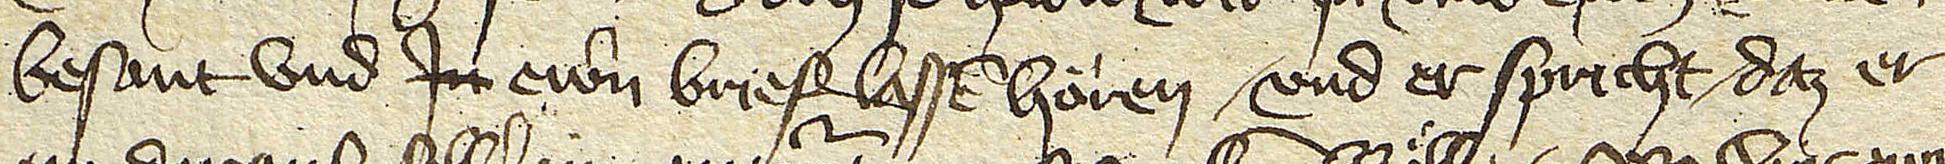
beſant vnd In ewn* brief laſſe* hören / vnd er ſpricht / daʒ er
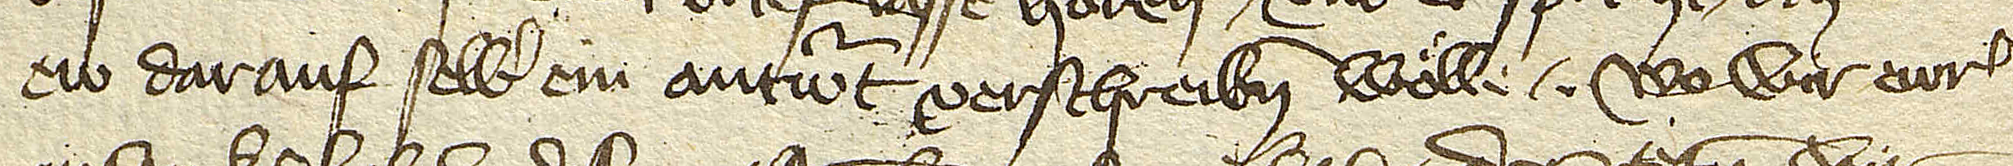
ew darauf ſelb* ein antw*t verſchreibn* wölle / . wo wir ewr*
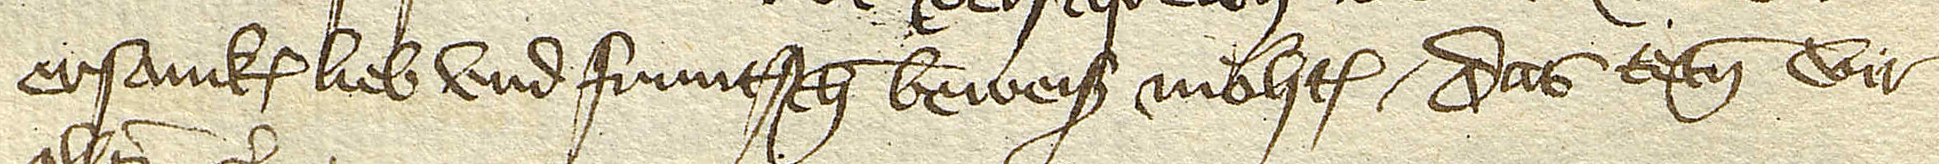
erſamk* lieb vnd fruntſch* beweiſ* möht* / Das tetn* wir
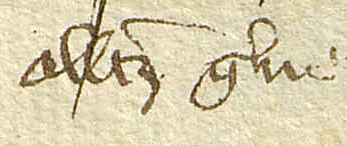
allcʒ* g*n
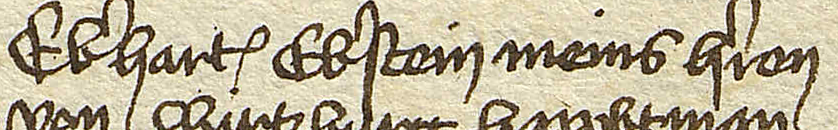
Eb*hart* Eb*ſtein meins hr*en
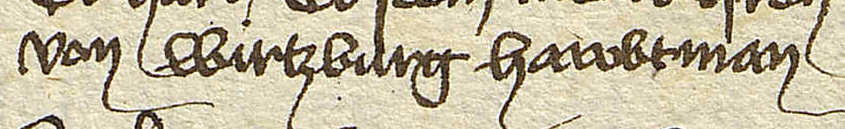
von wirtʒburg hawbtman
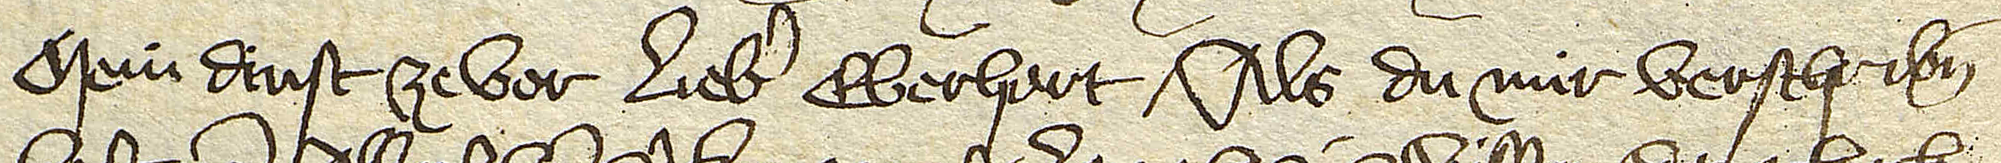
Mein dinſt cʒevor Lieb* Eberhart / Als du mir verſchribn*
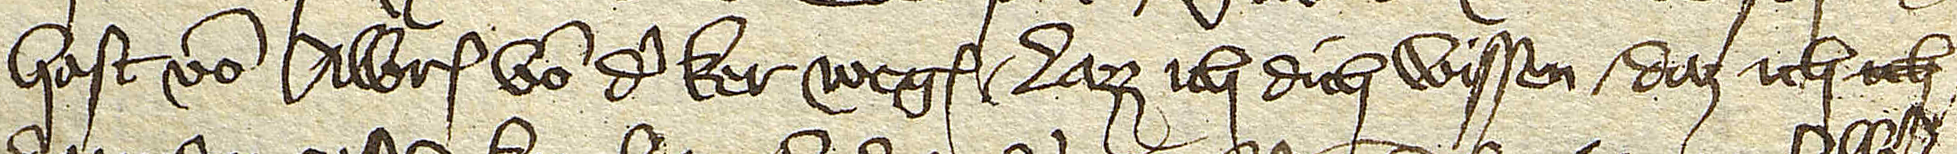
haſt vo* Albr* vo* d* ker weg* / Laʒʒ ich dich wiſſen / daʒ ich ich
